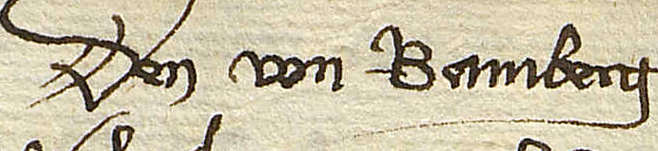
Den von Bamberg
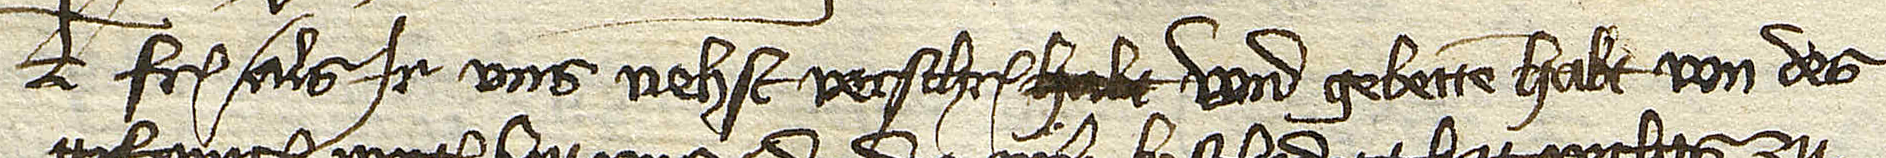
L* fr* als Ir vns nehſt verſchr* habt Vnd gebette* habt von des
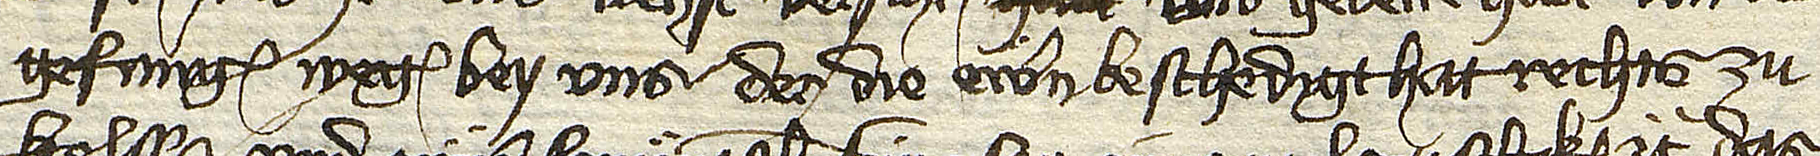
gefang* weg* bey vns der die ew*n beſchedigt hat rechts ʒu
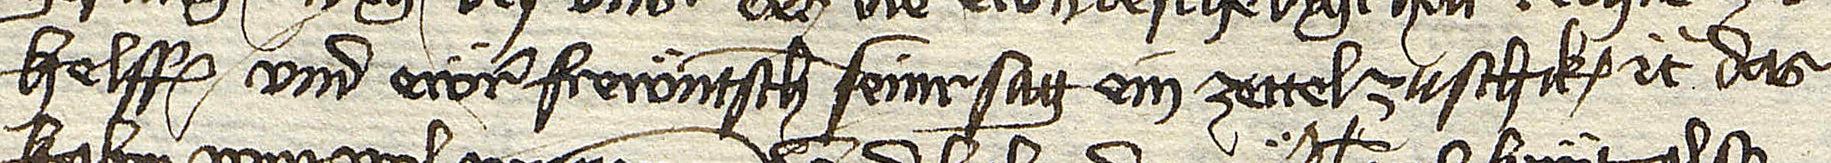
helff* vnd ew*r frewntſch* ſeinr ſag ʒettel ʒuſchik* ec* das
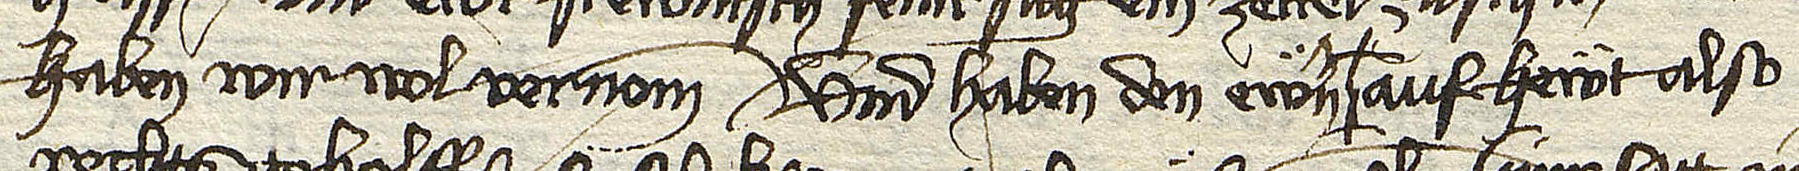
haben wir wol vernom* / Vnd haben den ew*n auf hewt alſo
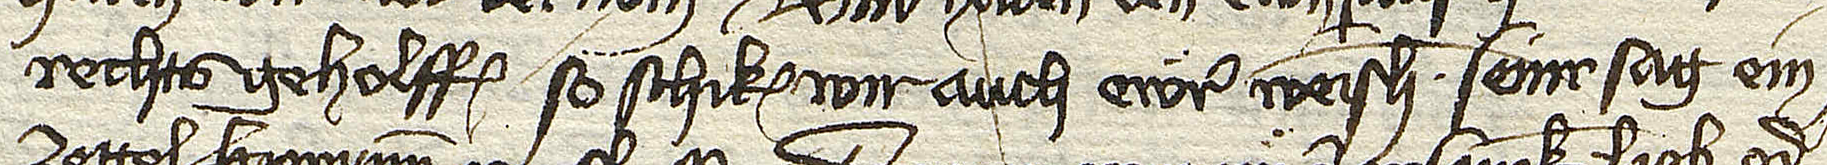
rechts geholff* / ſo ſchik* wir auch ew*r weiſh* . ſeinr ſag ein
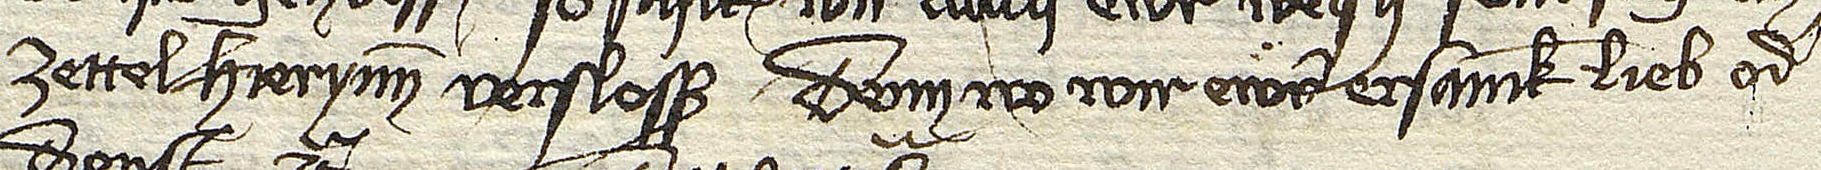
ʒettel hierynn* verſloſſ* / Denn wo wir ew*r erſamk* lieb od*
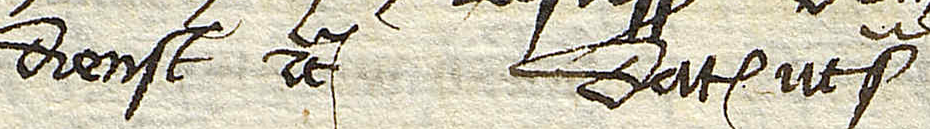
dienſt ec* Dat* ut ſ*
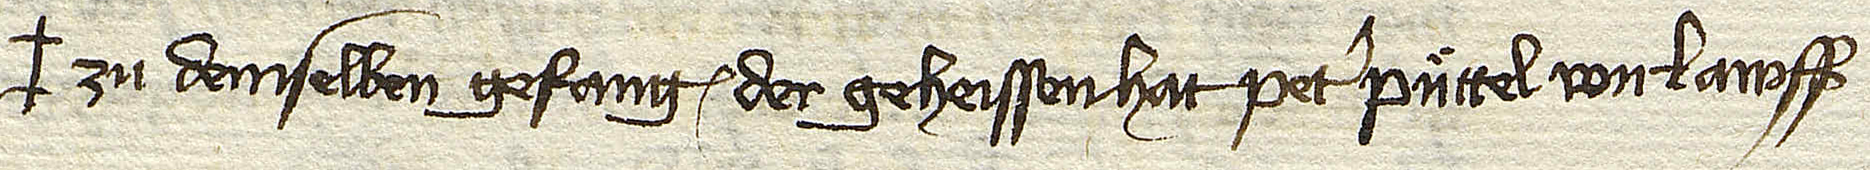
ʒu demſelben gefang* der geheiſſen hat pet* püttel von Lawff*
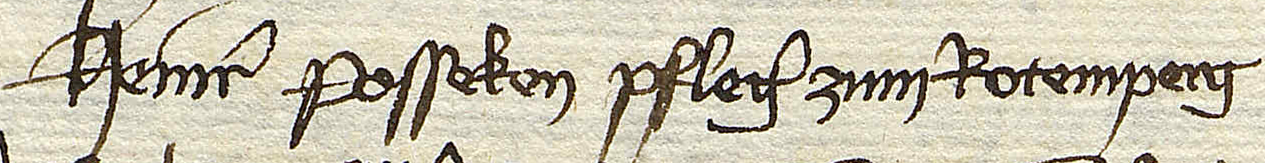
Heinr* Poſſeken pfleg* ʒum Rotemperg
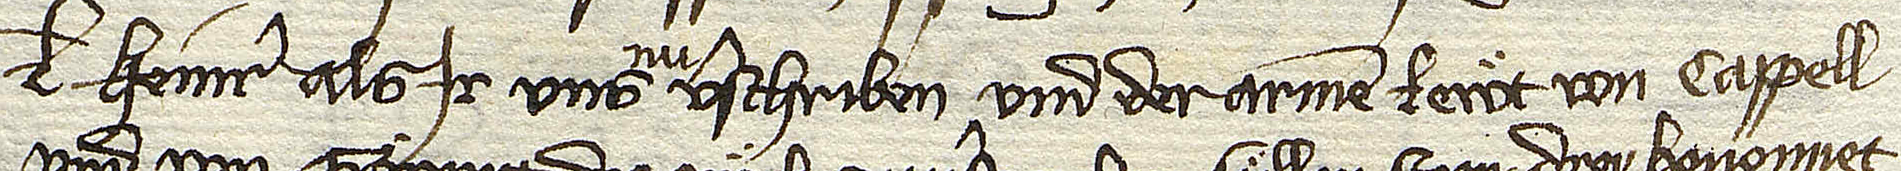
L* Heinr* als Ir vns v*ſchriben vnd der arme* lewt von Cappell
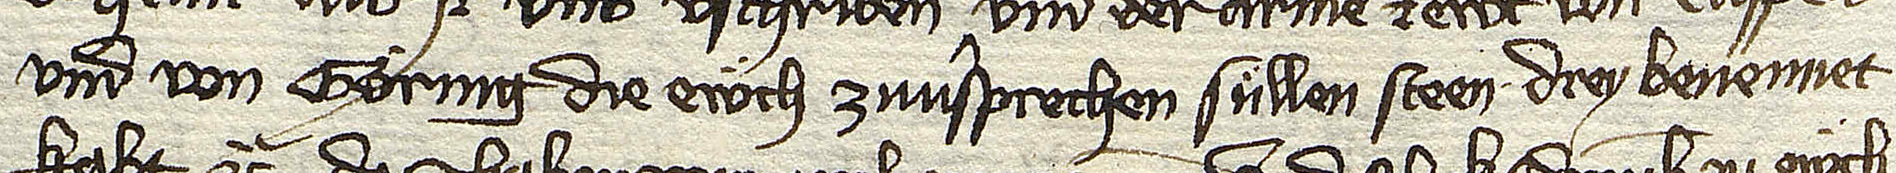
vnd von Görnig die ewch ʒuu*ſprechen ſüllen ſteen . drey benennet
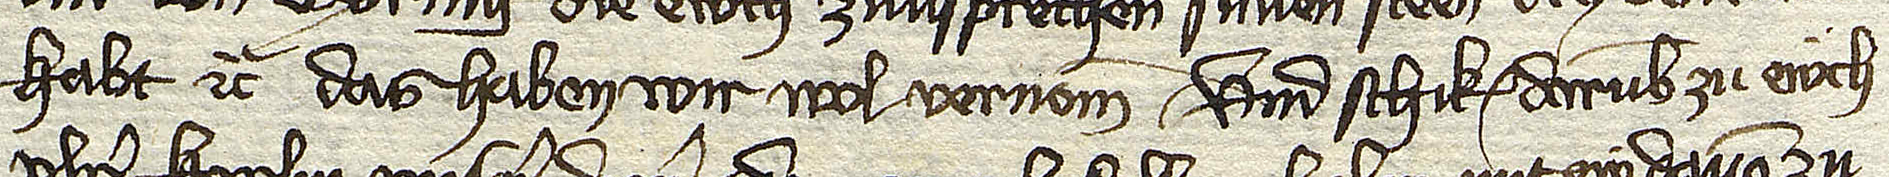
habt ec* das haben wir wol vernom* / Vnd ſchik* darub* ʒu ewch
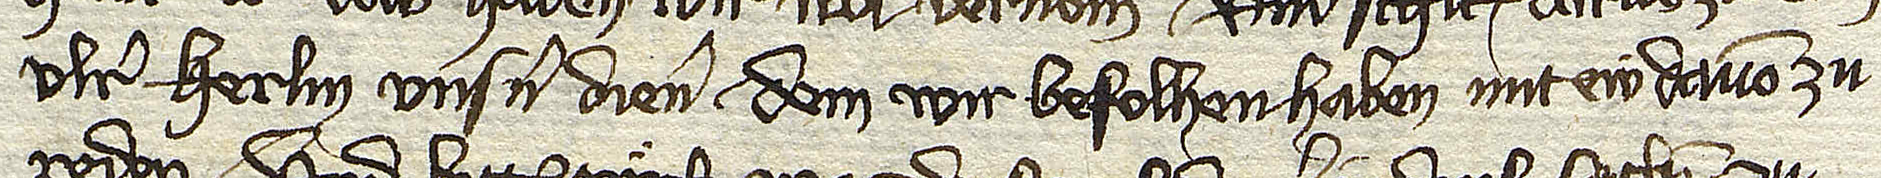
vlr* Herlin vnſ*n dien* / dem wir befolhen haben mit ew dauo* ʒu
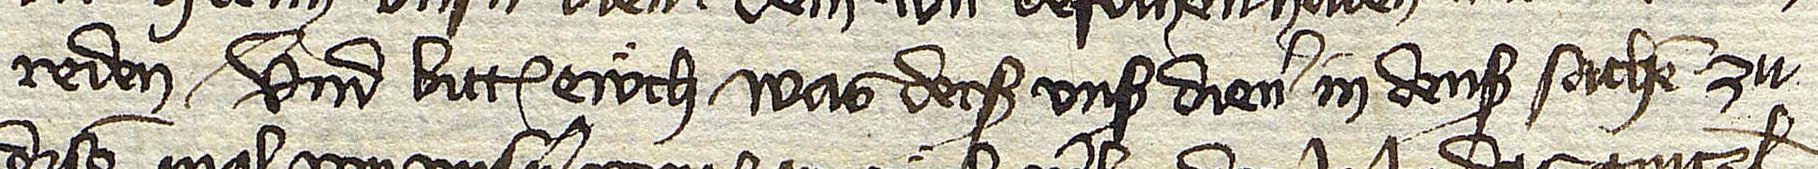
reden / Vnd bitt* ewch was derſ* vnſ* dien* in denſ* ſache* ʒu
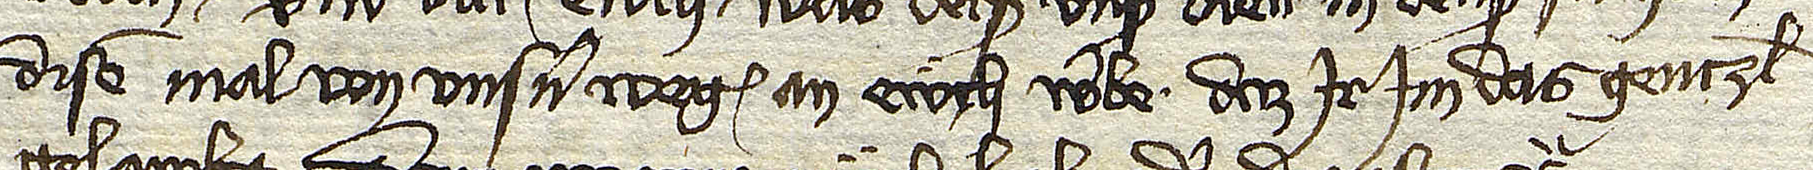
diſe* mal von vnſ*n weg* an ewch w*be . daʒ Ir Im das gencʒl*
